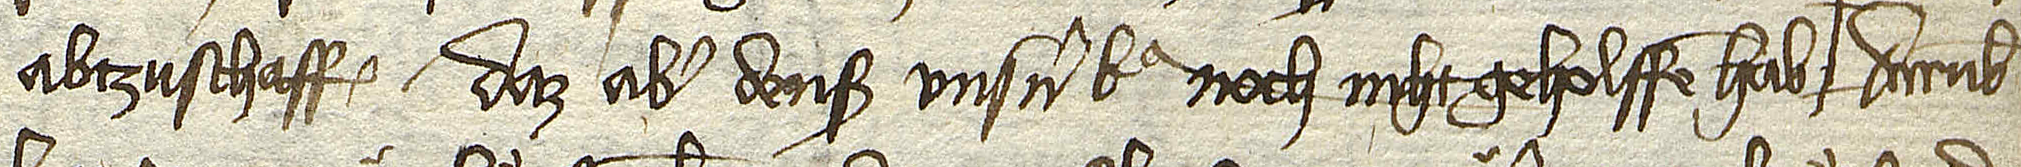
abʒuſchaff* / daʒ ab* denſ* vnſ*n b* noch niht geholffe* hab daru*b
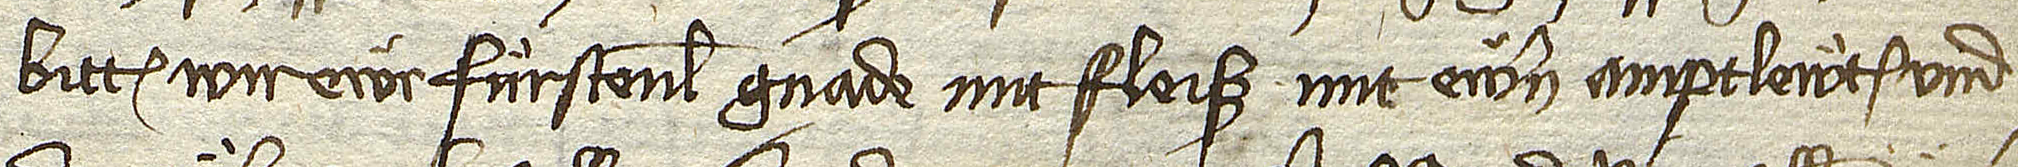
bitt* wir ewr fürſtenl* gnade mit fleiſʒ . mit ew*n amptlewt* vnd
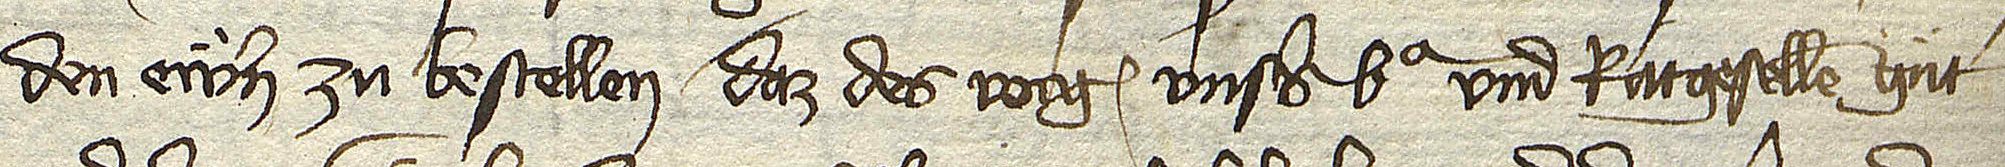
den ew*n ʒu beſtellen / daʒ des vorg* vnſ*s b* vnd Ratgeſelle* güt*
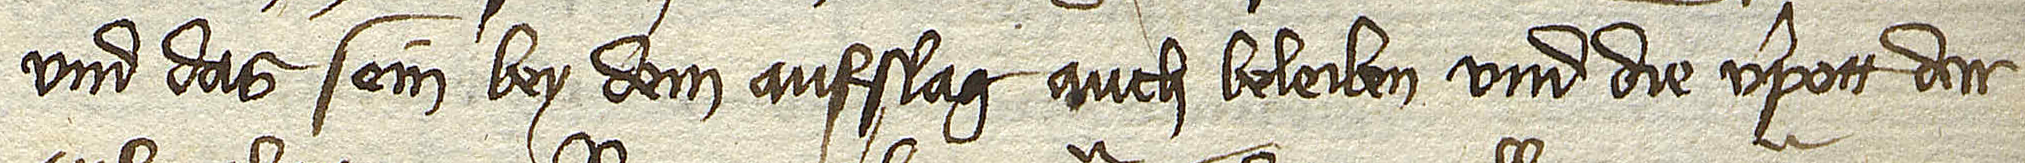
vnd das ſein bey dem aufſlag auch beleiben vnd die v*pott dar
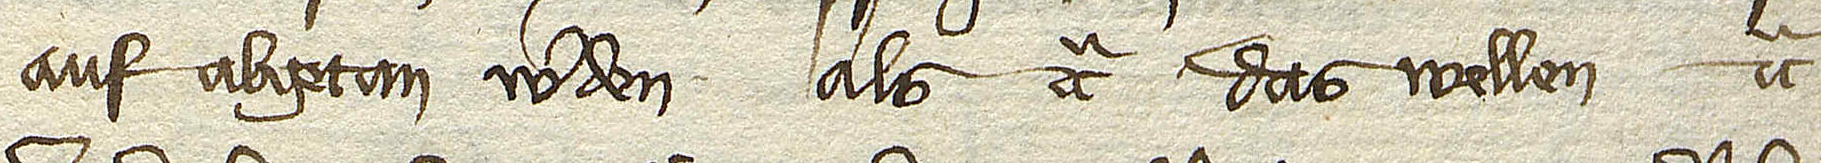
auf abgetan w*den als ec* das wellen ec*
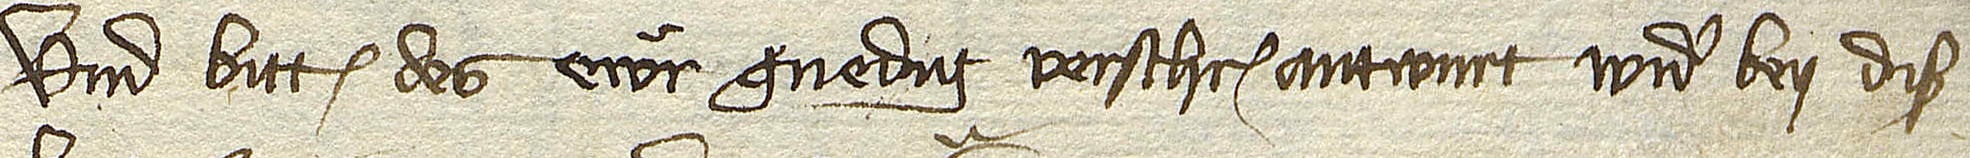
Vnd bitt* des ewr gnedig verſchr* antwurt wid* bey diſ*
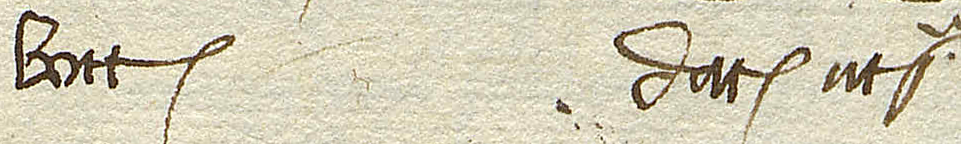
bott* dat* ut ſ*
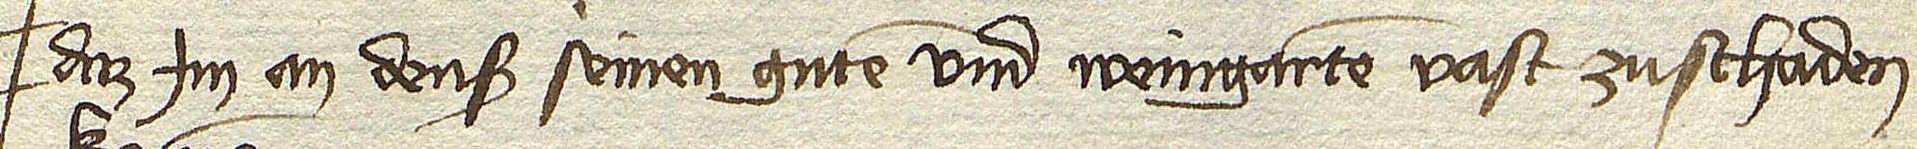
daʒ Im an denſ* ſeinen gute* vnd weingarte* vaſt ʒuſchaden
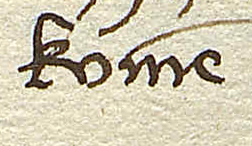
kome*
